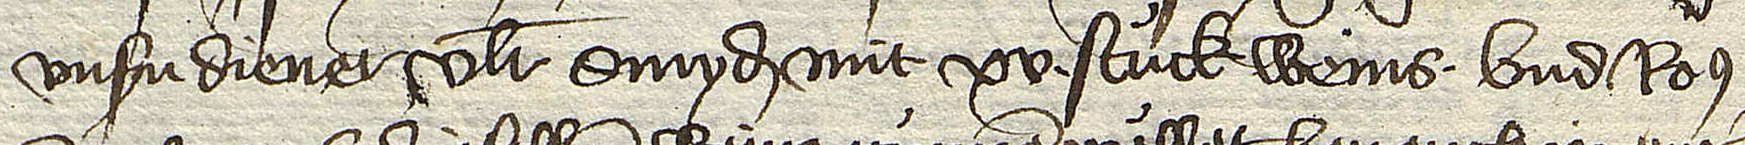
vnſ*n diener vlr* Smyd* mit xv . ſtück weins . vnd Ro*
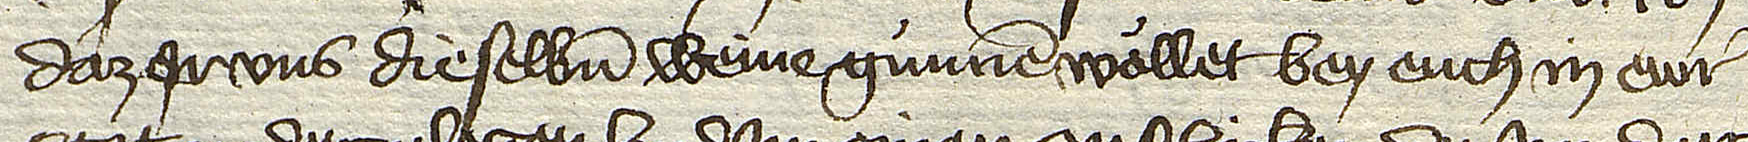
daʒ Ir vns dieſelb*n weine günne* wöllet bey euch in ewr*
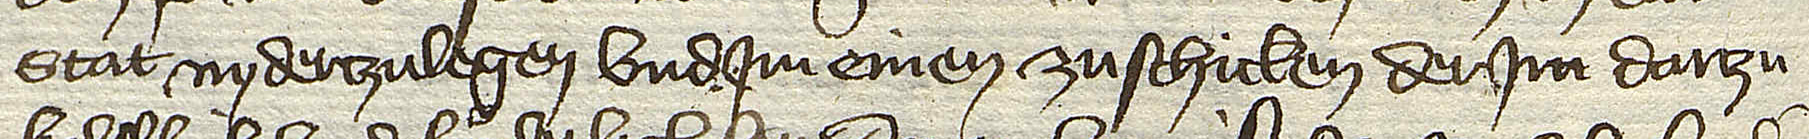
Stat nydercʒulegen vnd Im einen cʒu ſchicken der Im darcʒu
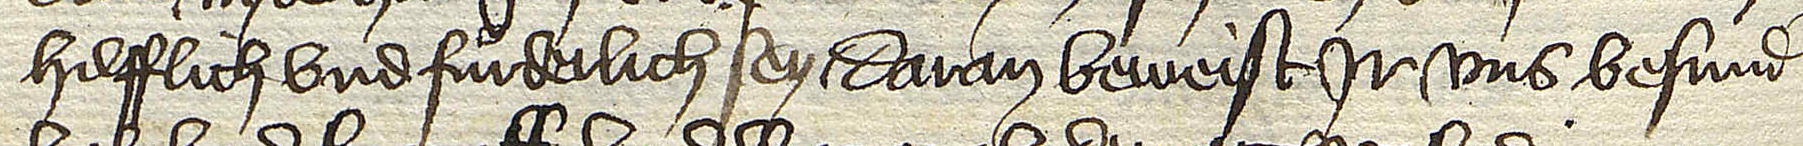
hilfflich vnd fürderlich ſey / Daran beweiſt Ir vns beſund*
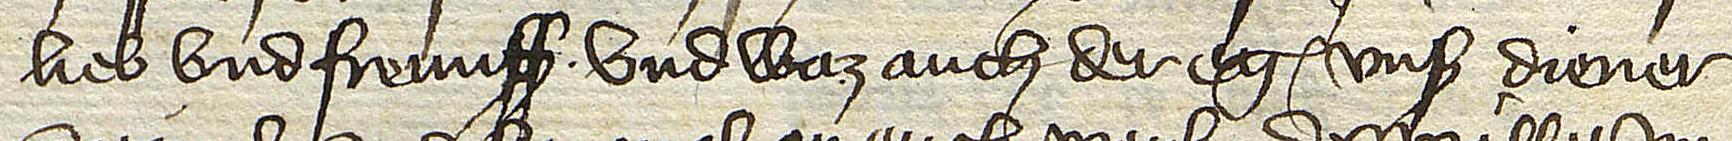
lieb vnd freuntſ* . vnd waʒ auch der eg* vnſ* diener
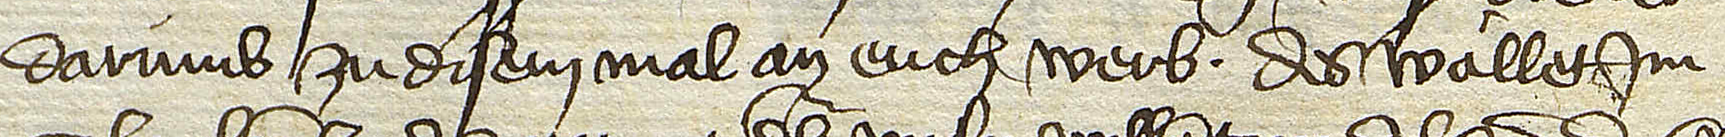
darümb cʒu diſem mal an euch werb * des wöllet Im
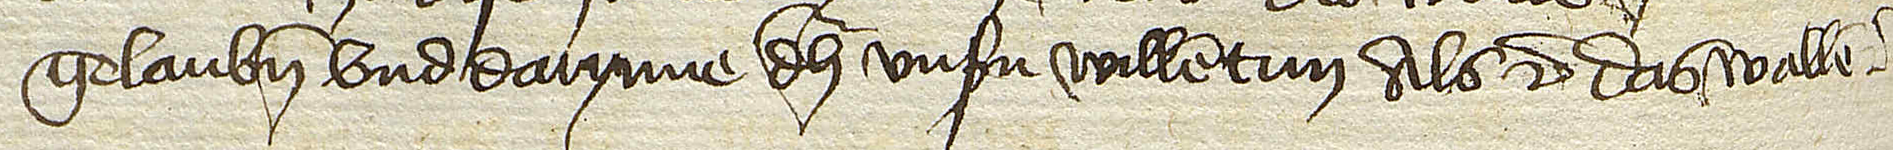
gelaub*n vnd darynne d*h* vnſ*n wille* tun Als ec* Das wolle* ec*
